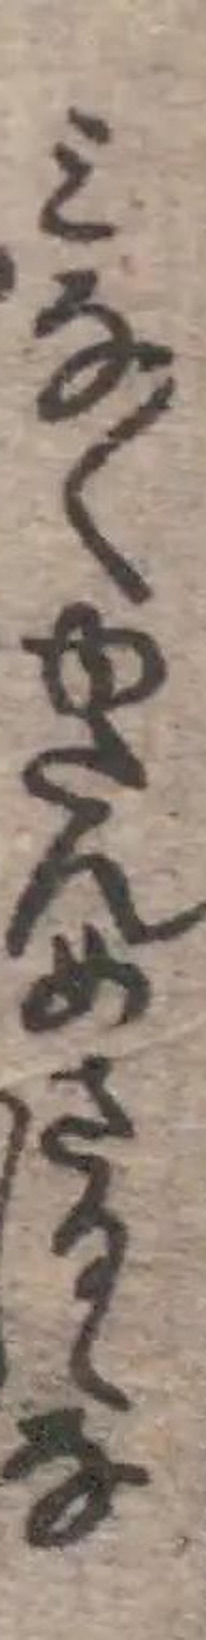みな〳〵ゆたんめさるゝな
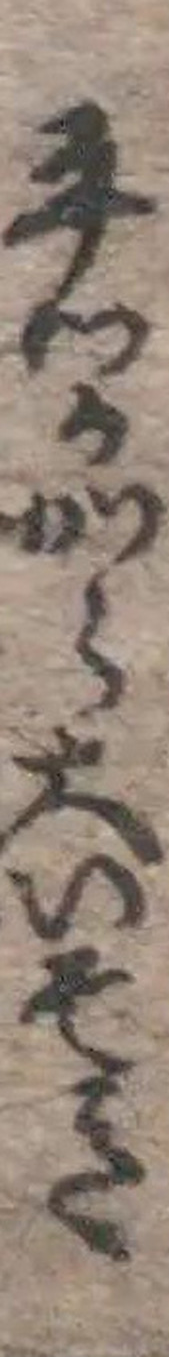平つかから大いそ迄
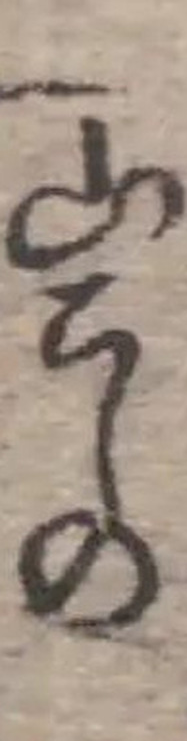山こしの
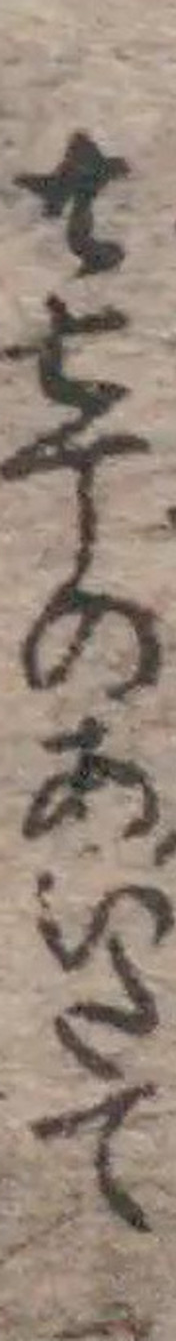廿七丁のあいたて
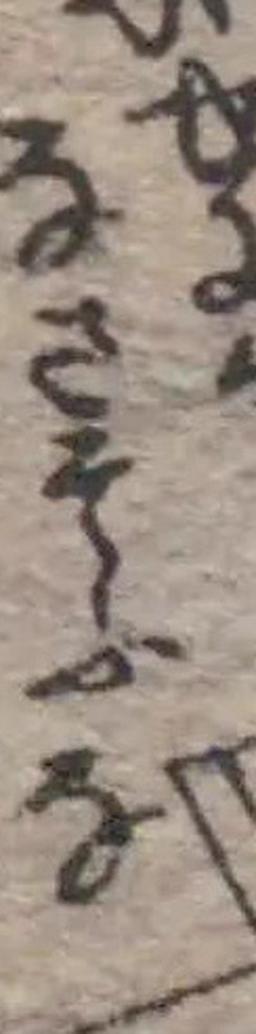なさそふな
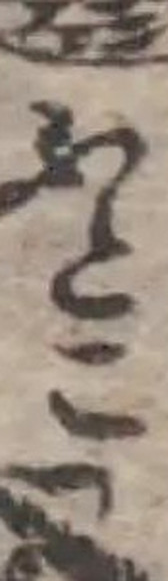ふとこ
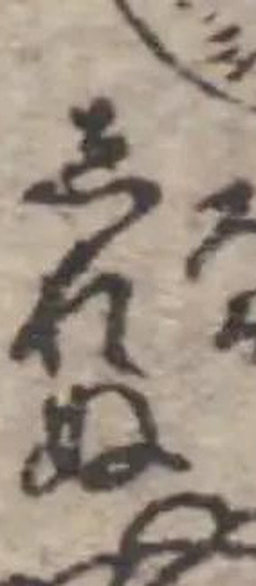しれぬ
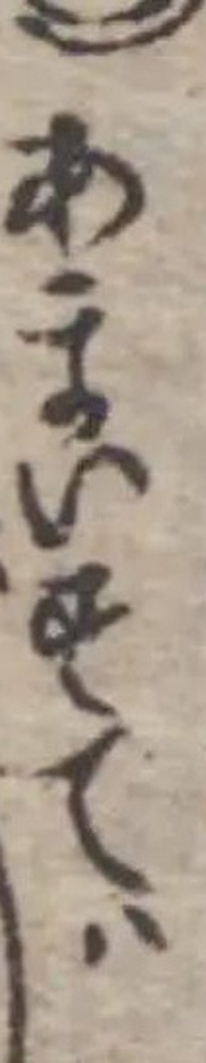あまいすては
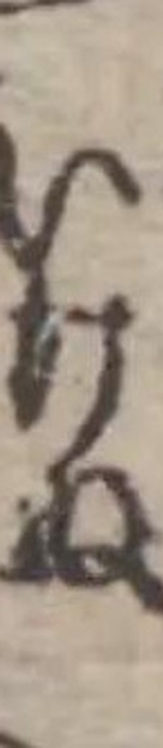いけぬ
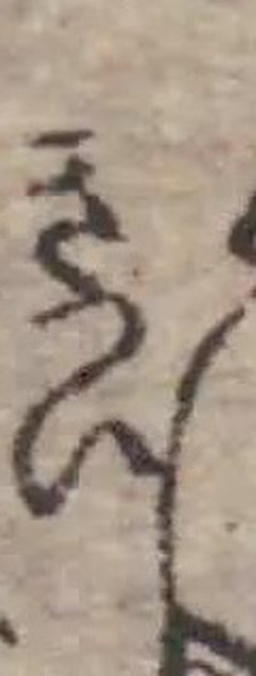きつい
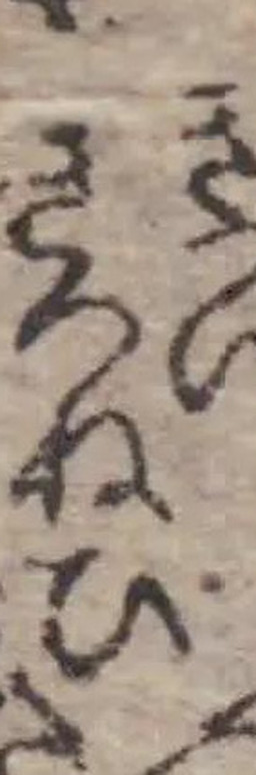きつねひ
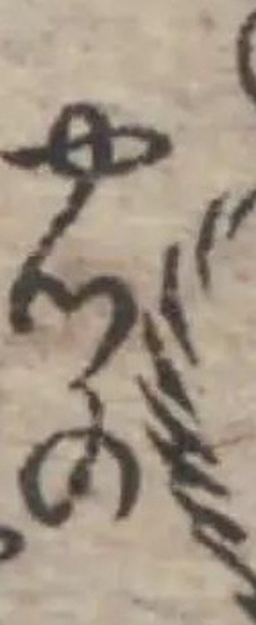やつの
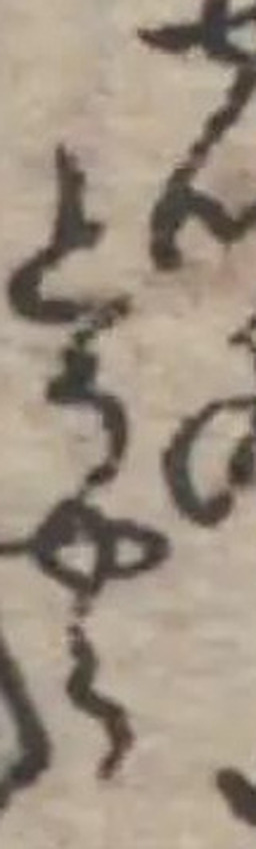とうやら

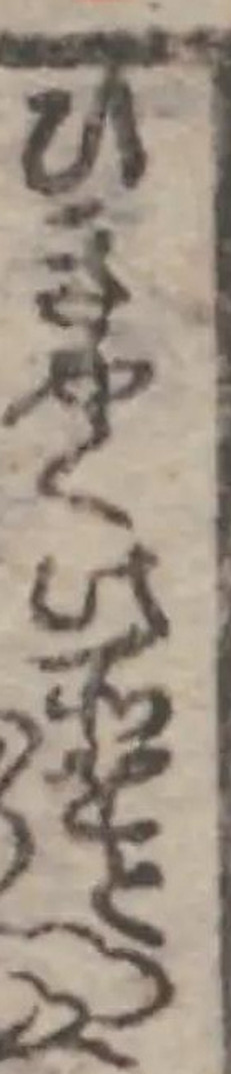ひきやく此所をと
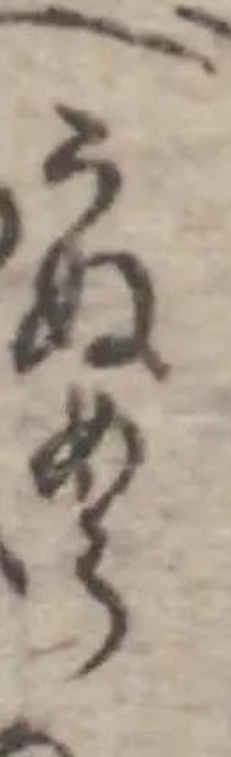うぬめら
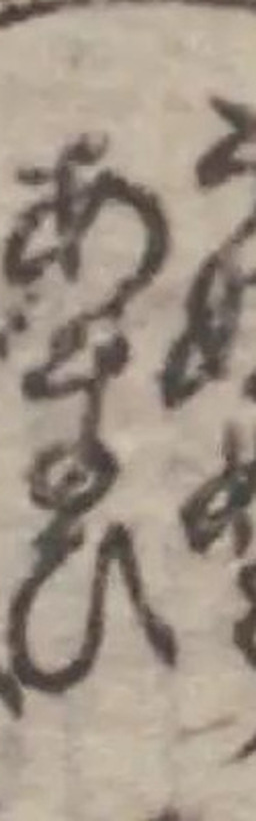あまひ
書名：大磯地蔵咄 2巻
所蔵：国立国会図書館 National Diet Library, JAPAN
